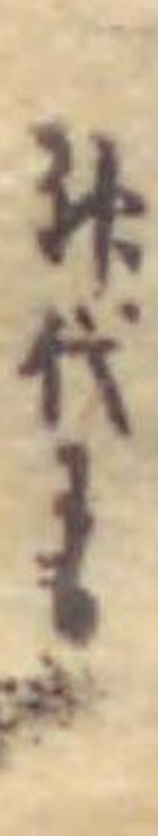神代にも
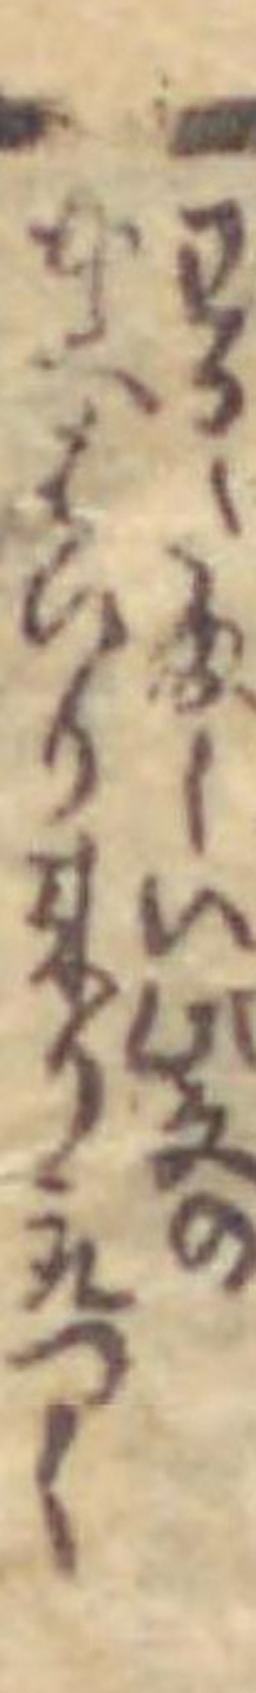中へはいり来り取つく
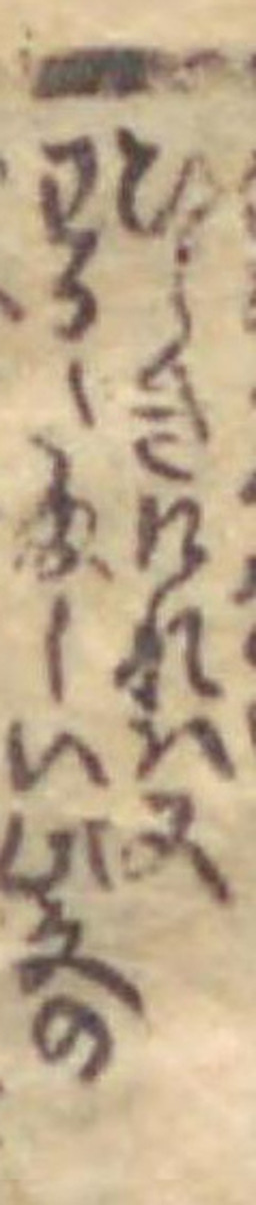わるたましい此文の
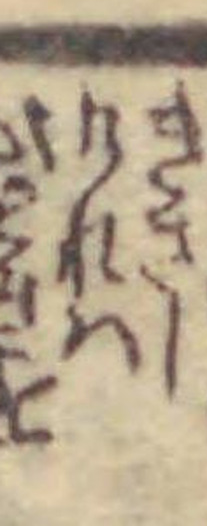けれは
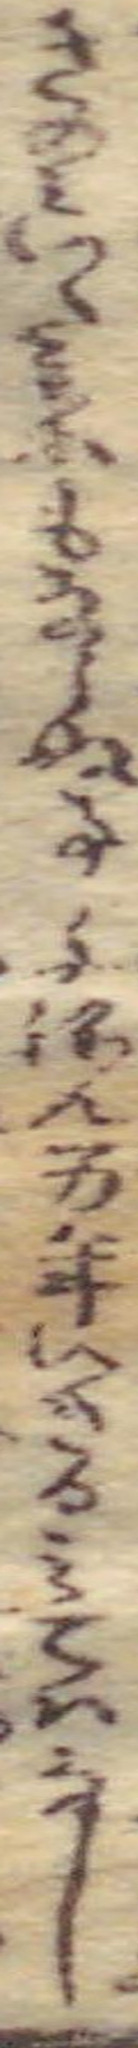きのみいたみにもならぬ事千年万年いきるみてはなし
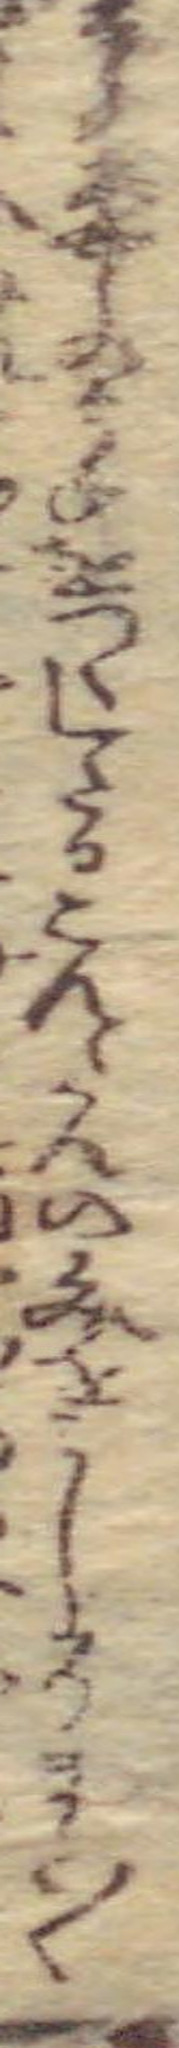理太郎はあやしのか手をつくしたるこんたんの文をみしよりまた〳〵
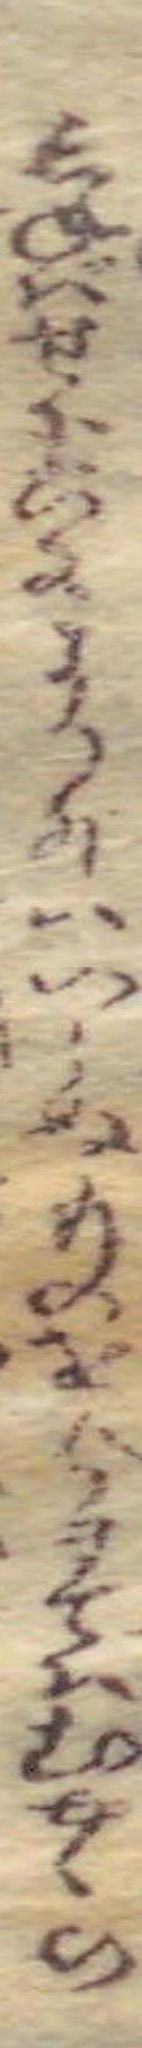しねばせに六により外はいらぬものを今まてはむやく
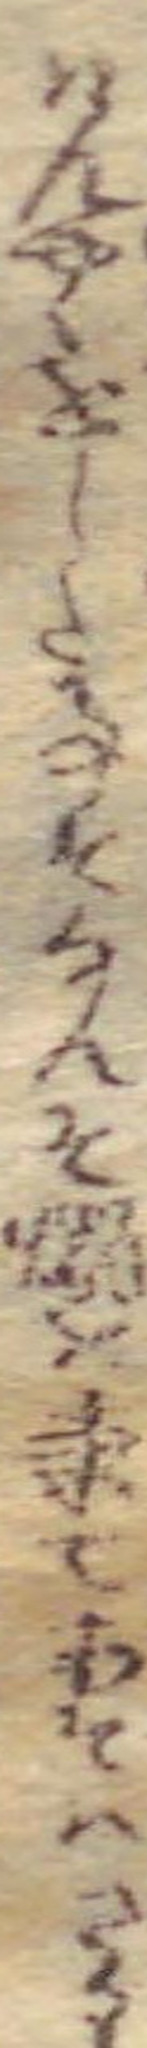けんやくをした事そなんそ燭を秉てあそはさると
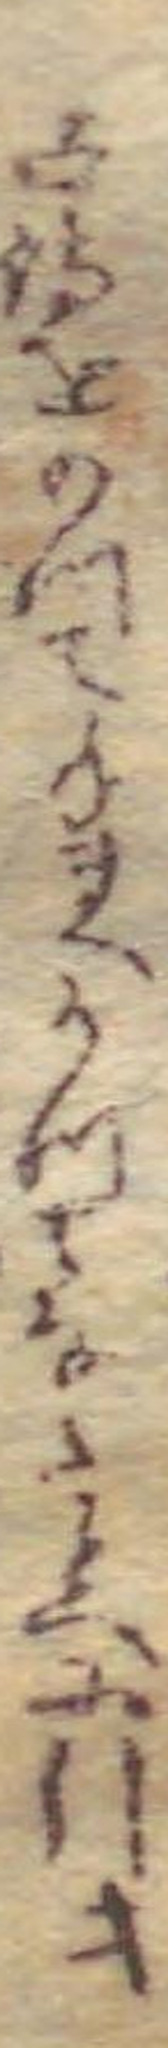古伝をもつて手まへかつてなたとへに引き
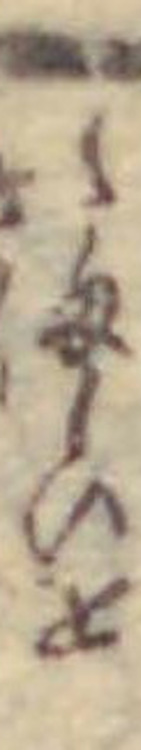たましいを
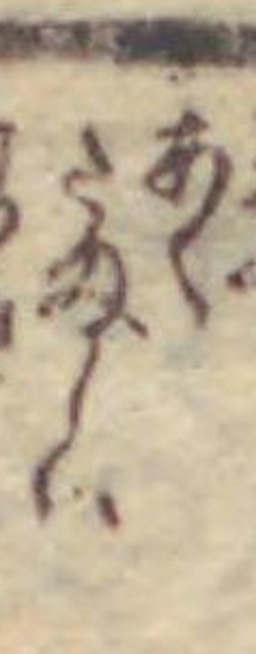たましい
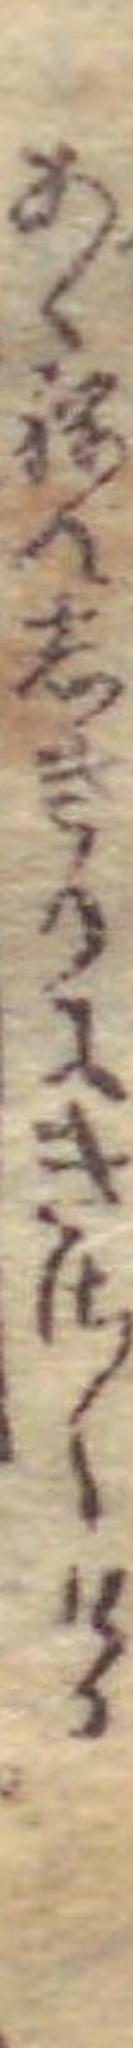あくねんしきりにきさしける
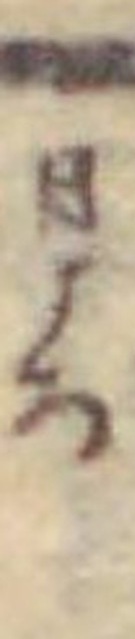日ころ

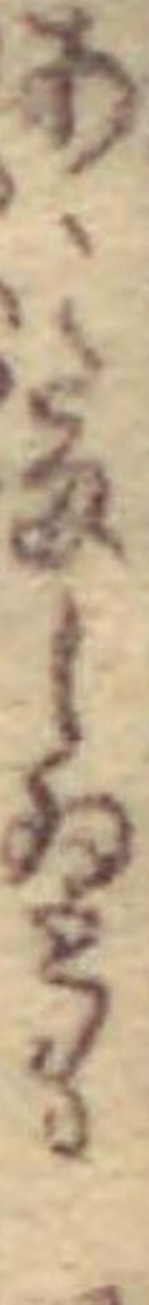あくたましゐとも
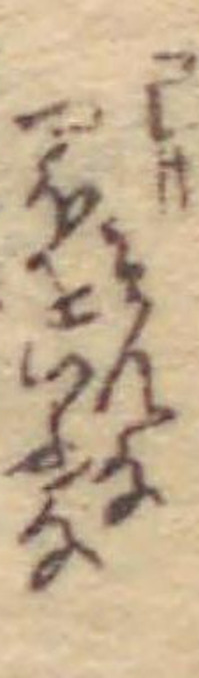やほをいふな
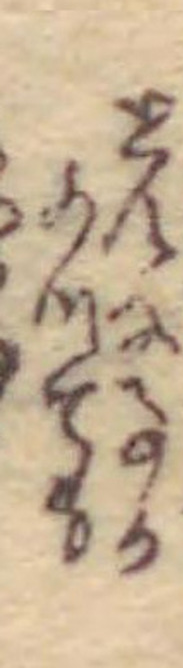とんな事か
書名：心学早染艸 : 3巻
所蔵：国立国会図書館 National Diet Library, JAPAN
